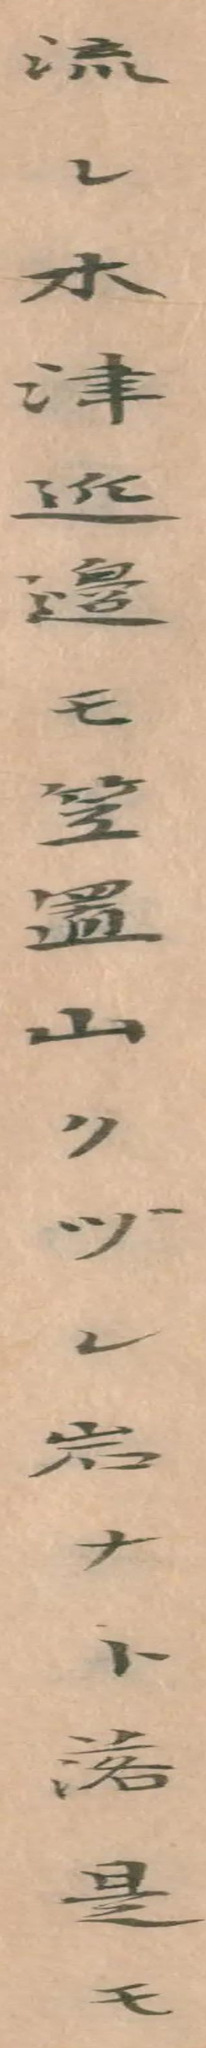流シ木津近辺モ笠置山クヅレ岩ナト落是モ
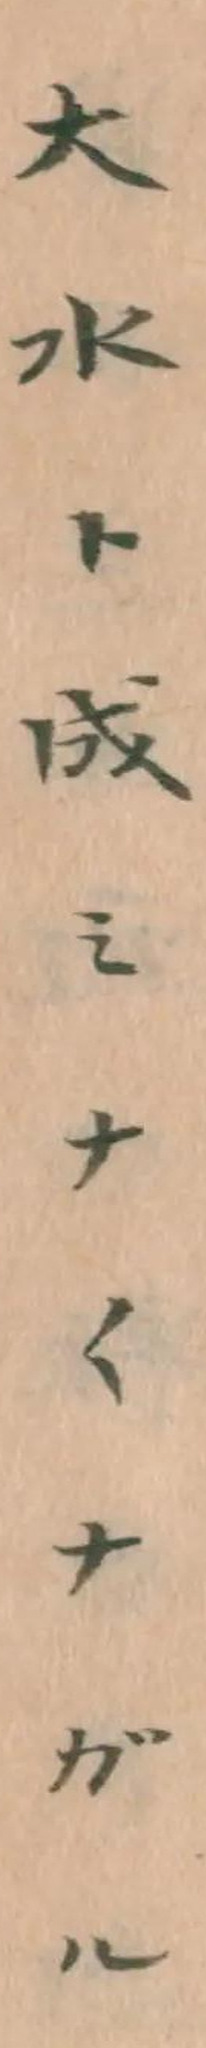大水ト成ミナ〳〵ナガル
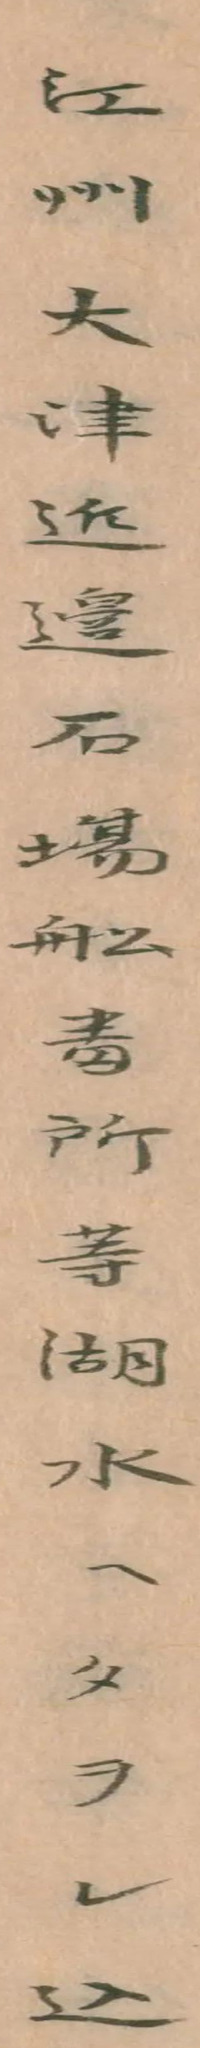一江州大津近辺石場船番所等湖水へタヲレ込
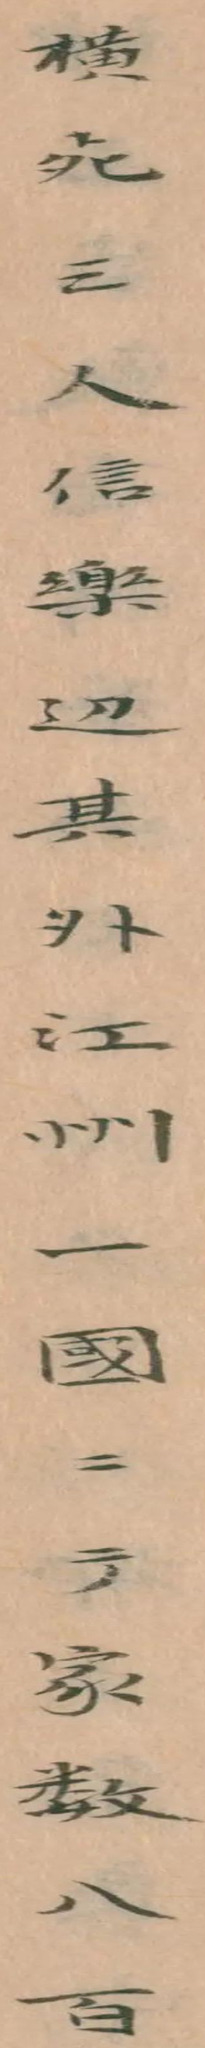横死三人信楽辺其外江州一国ニテ家数八百
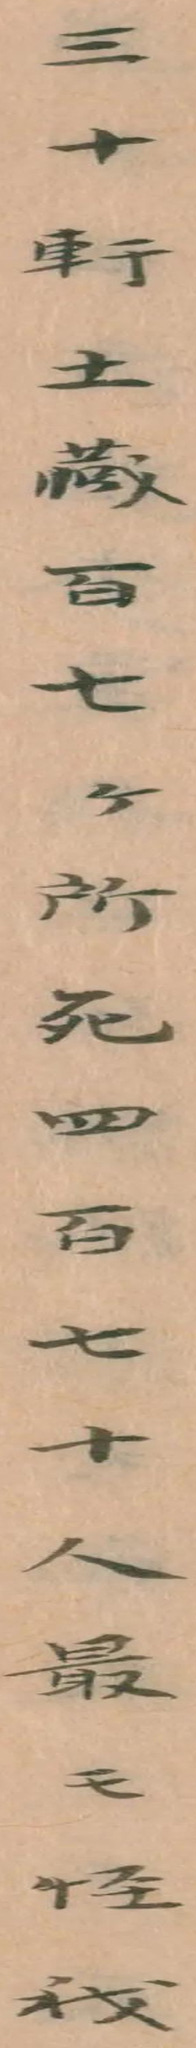三十軒土蔵百七ヶ所死四百七十人最モ怪我
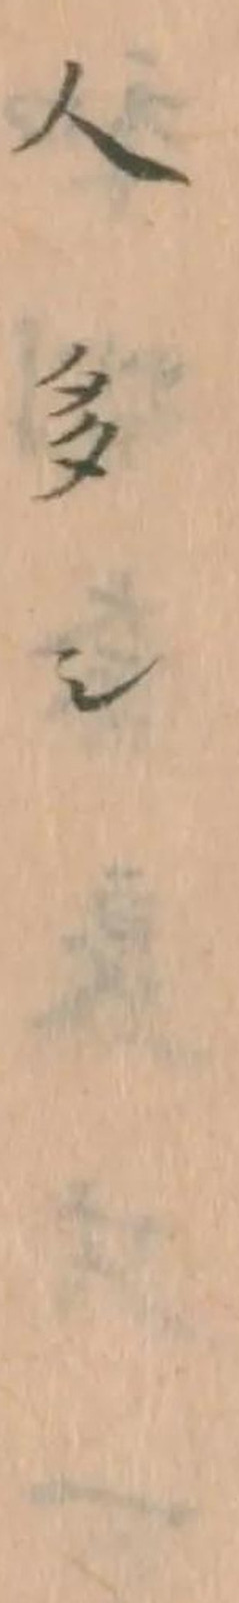人多シ
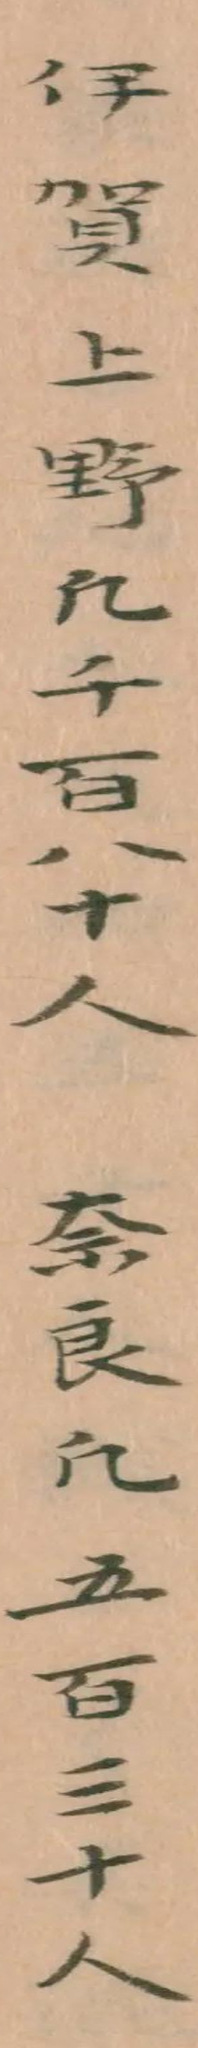死人改伊賀上野九千百八十人奈良凡五百三十人
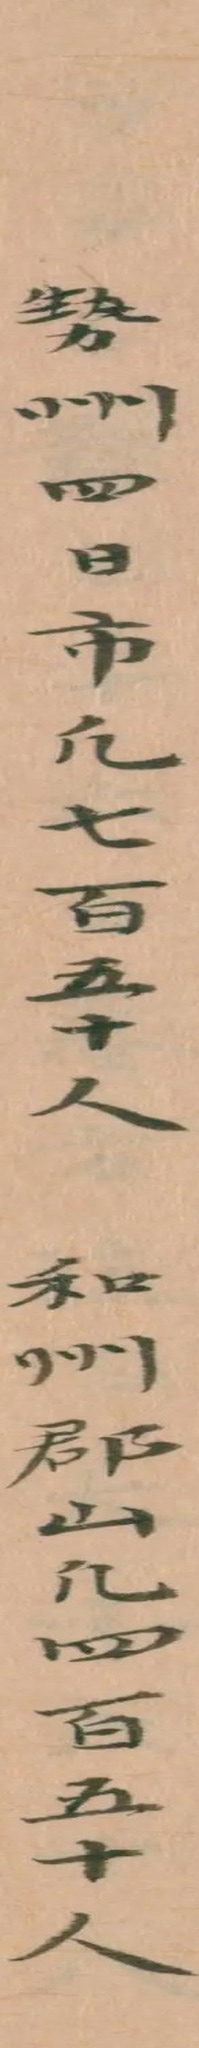勢州四日凡七五〇人和州郡山凡四百五十人
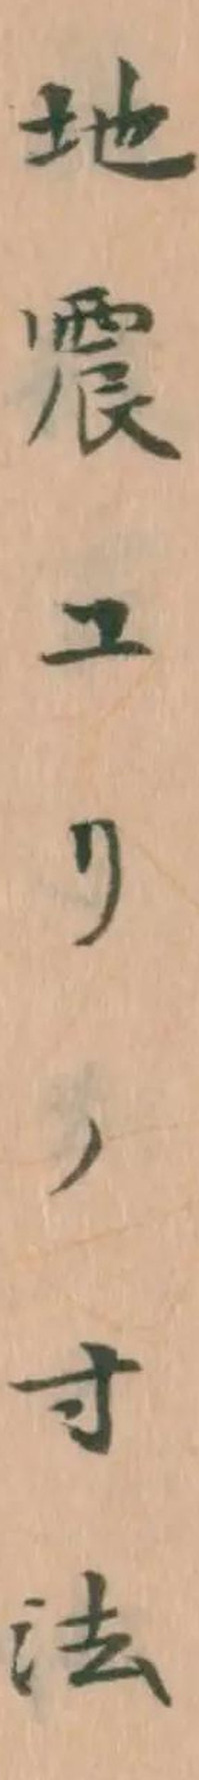地震ユリノ寸法
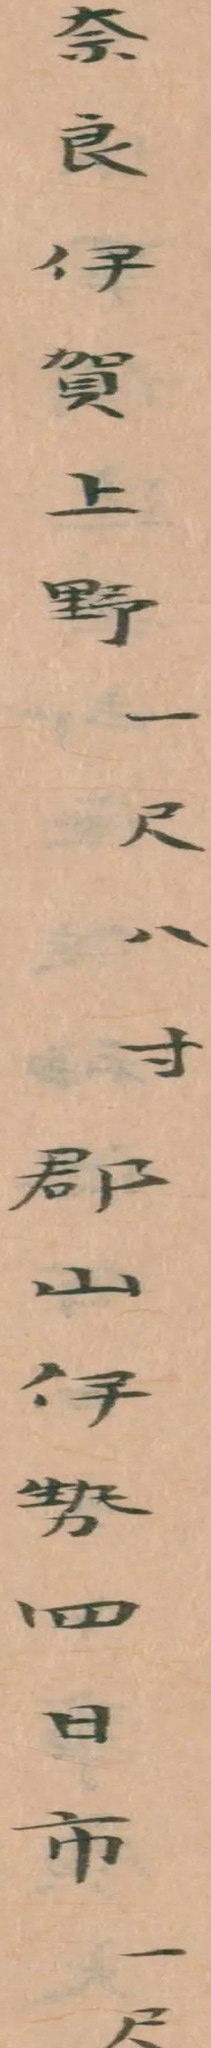奈良伊賀上野一尺八寸郡山伊勢四日市一尺五寸
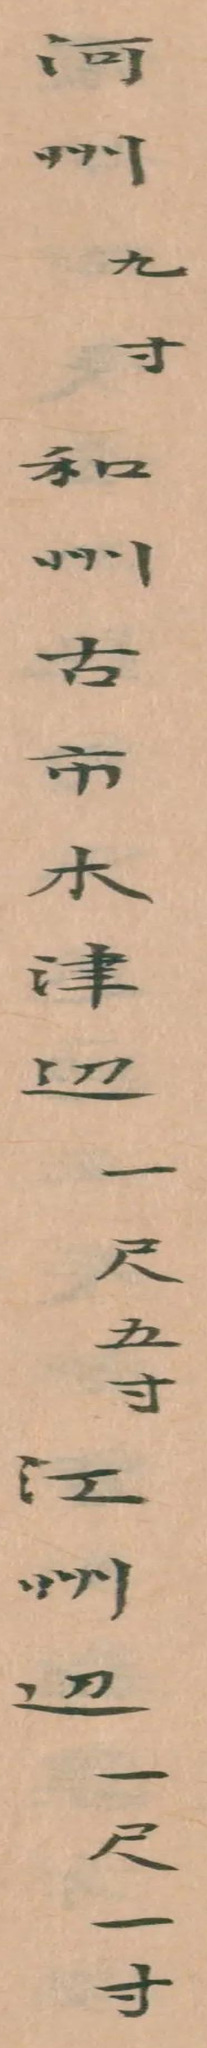河川九寸和州古市木津辺一尺五寸江州辺一尺一寸
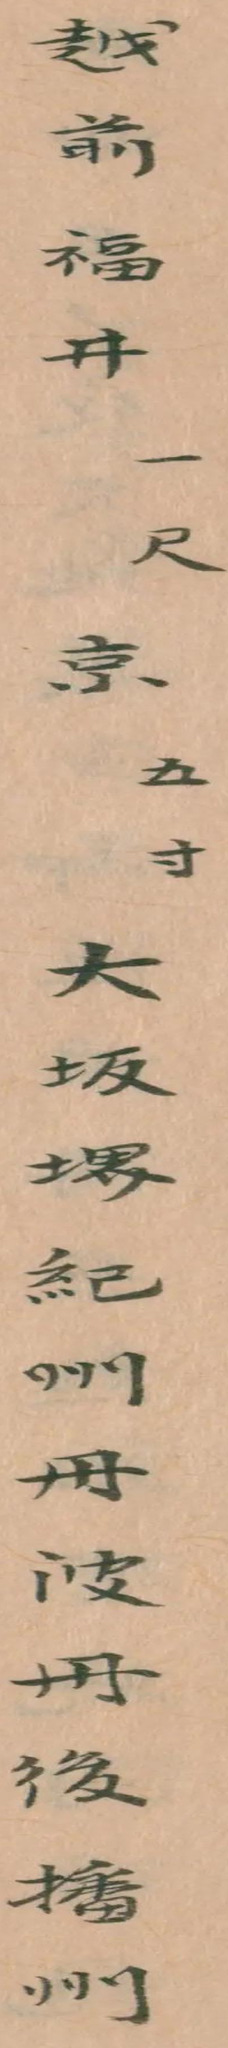越前福井一尺京五寸大坂堺紀州丹波丹後播州
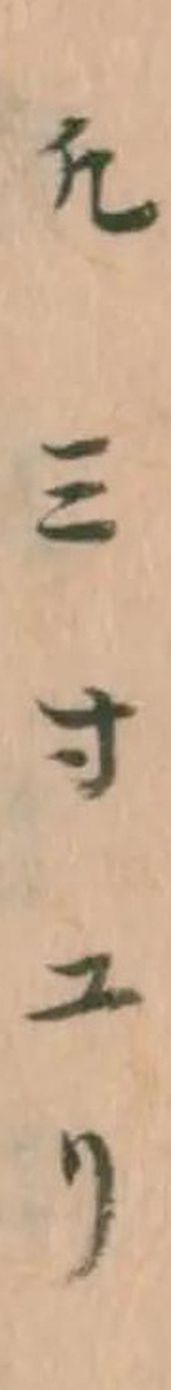凡三寸ユリ
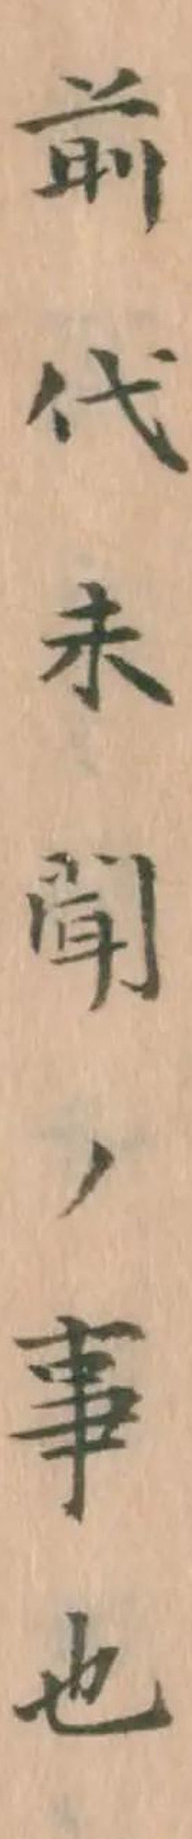前代未聞ノ事也
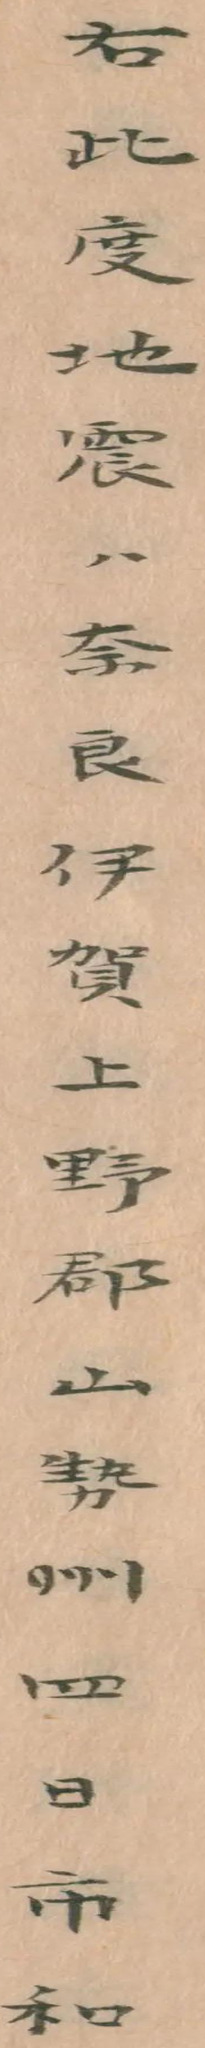右此度地震ハ奈良伊賀上野郡山勢州四日市和
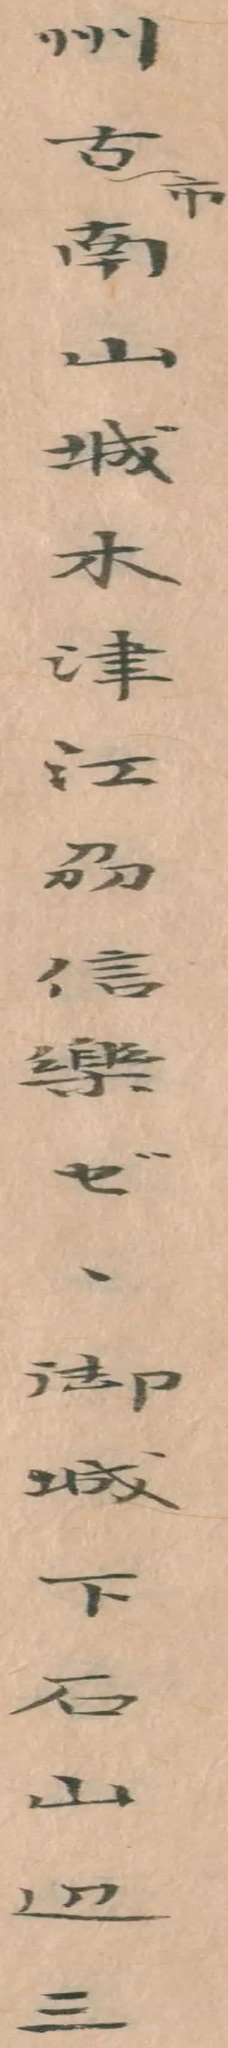州古市南山城木津江州信楽ぜゝ御城下石山辺三
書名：地災撮要. 巻1(噴火山・地震ノ部)
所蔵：国立国会図書館 National Diet Library, JAPAN
